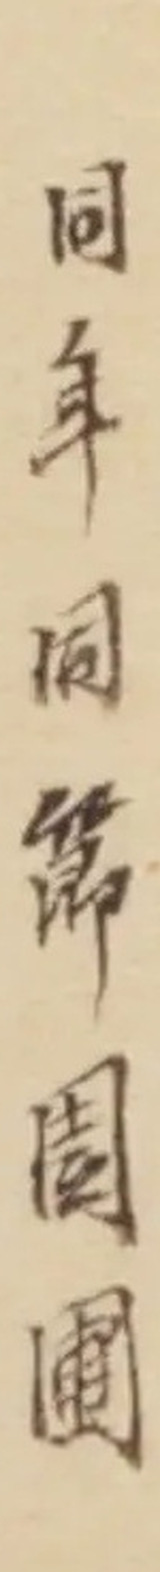同年同節園圃
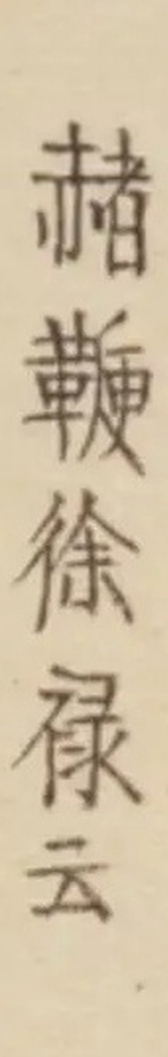赭鞭徐禄云

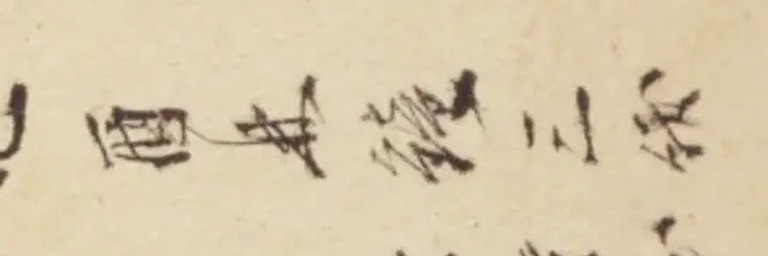乙酉林鐘三
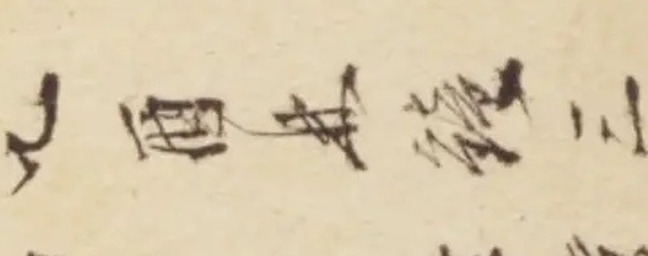乙酉林鐘三
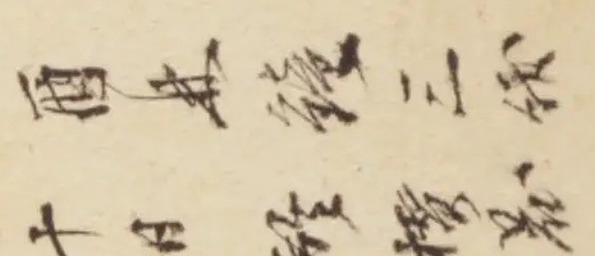乙酉林鐘三
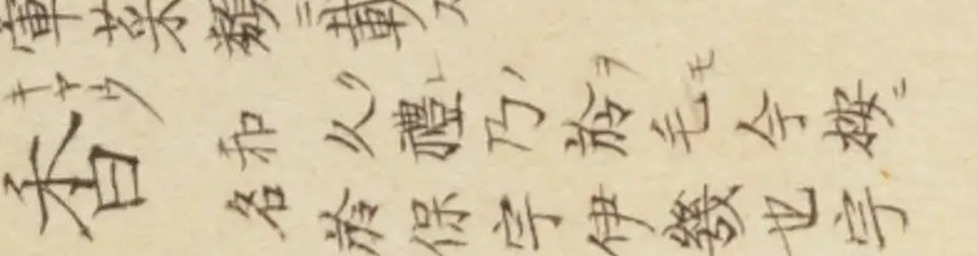香和久禮乃於毛今按に
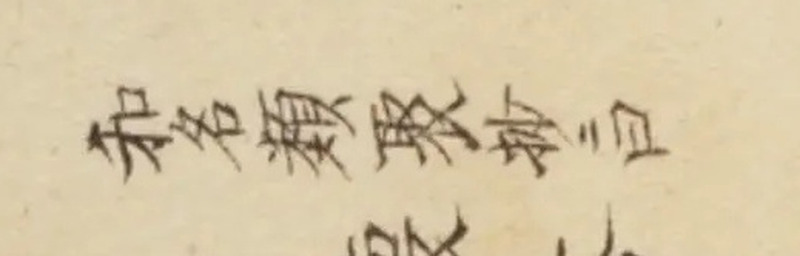和名類聚抄に云
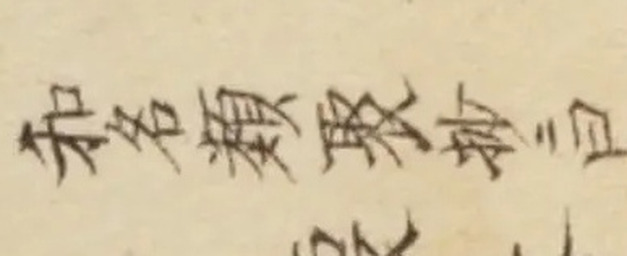和名類聚抄に云
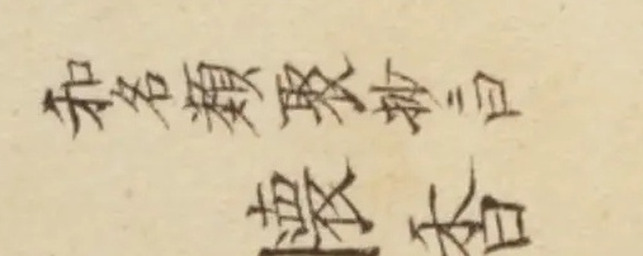和名類聚抄に云
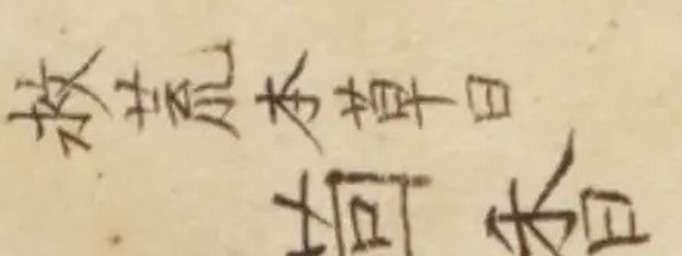救荒本草曰

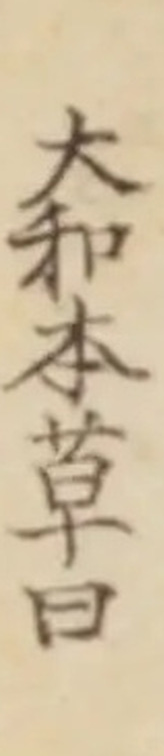大和本草曰
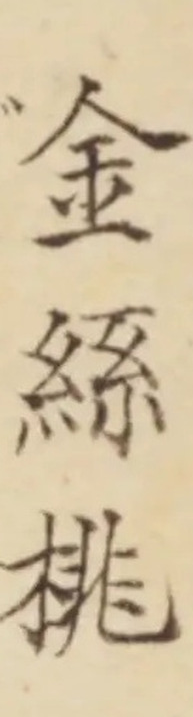金絲の
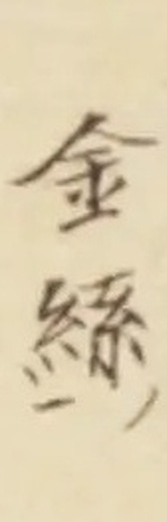金絲の
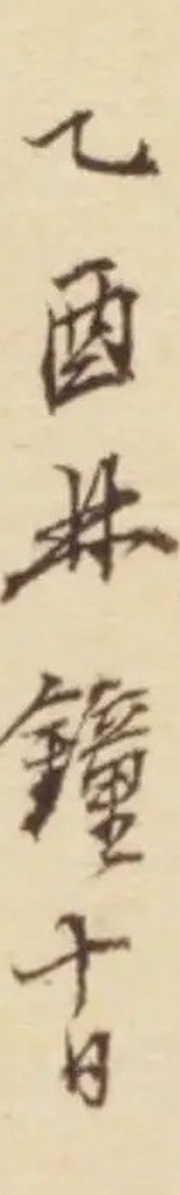乙酉林鐘十日

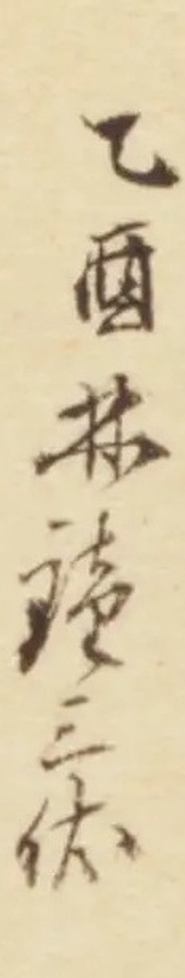乙酉林鐘三伏
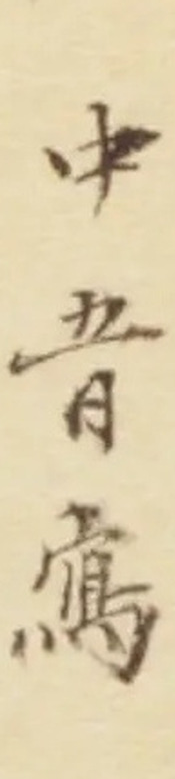中五日寫
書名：梅園草木花譜夏之部. 3
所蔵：国立国会図書館 National Diet Library, JAPAN
